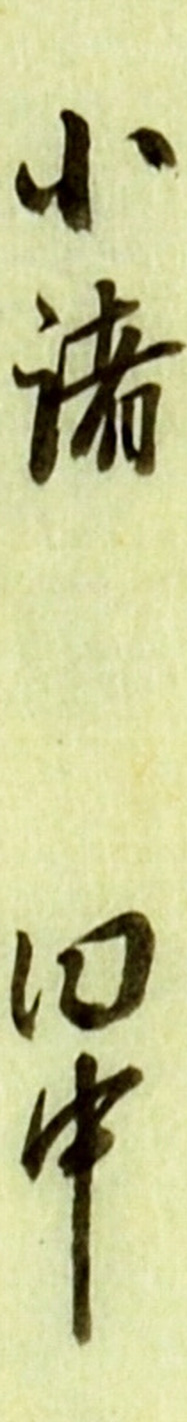小諸田中
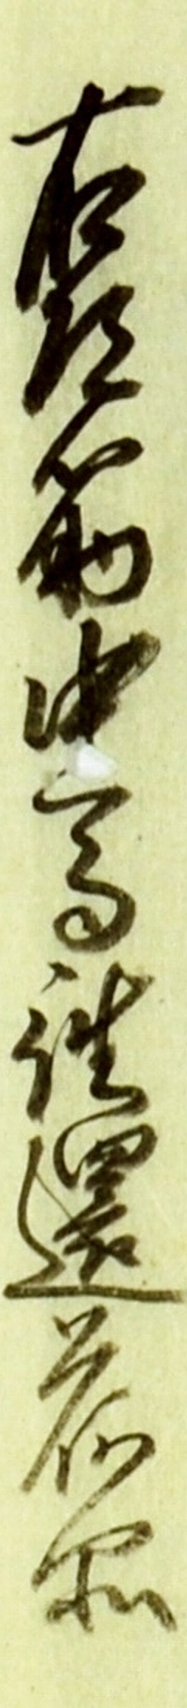右道筋中馬往還荷品
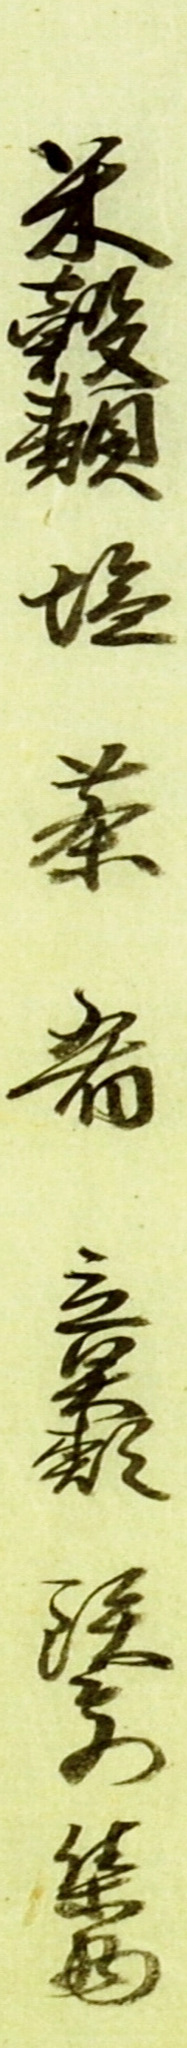米穀類塩茶肴立具類鉄もの集物

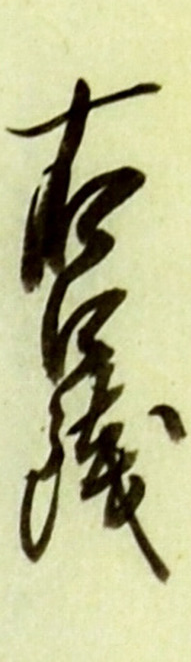右口銭
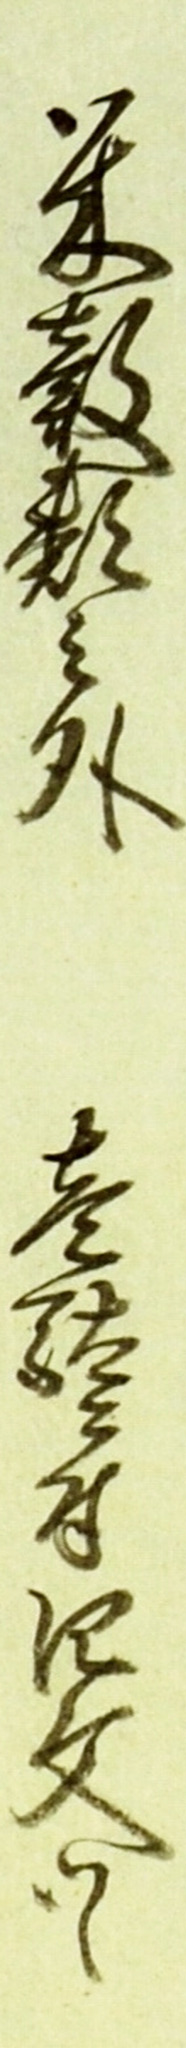米穀類之外壱駄ニ付四文ツヽ
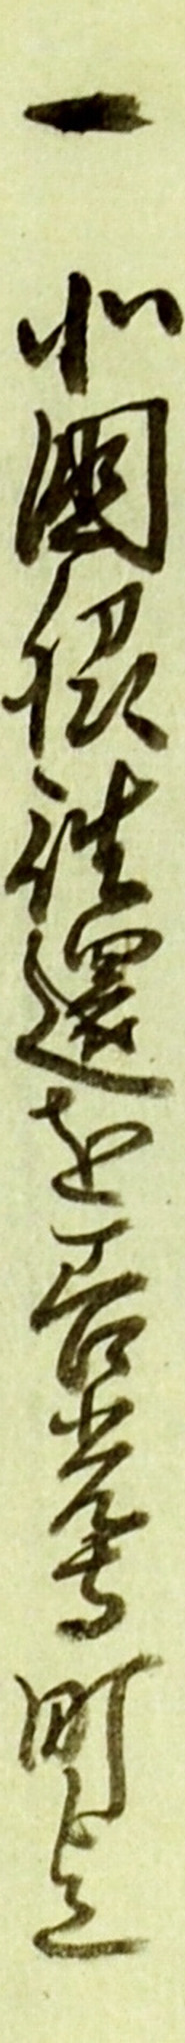一北国脇往還を善光寺町迄
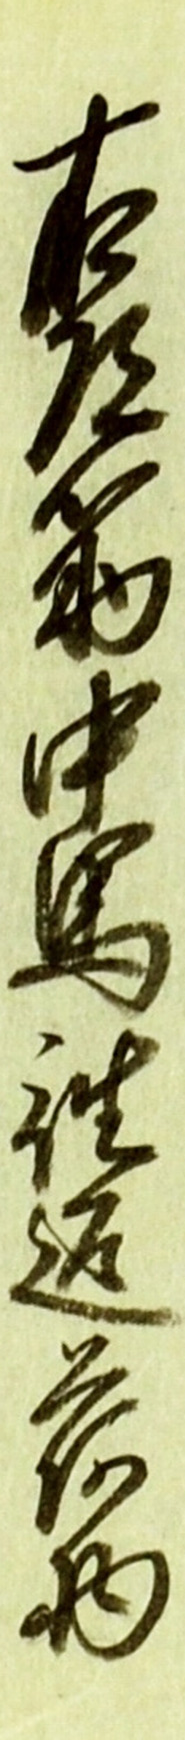右道筋中馬往返荷物
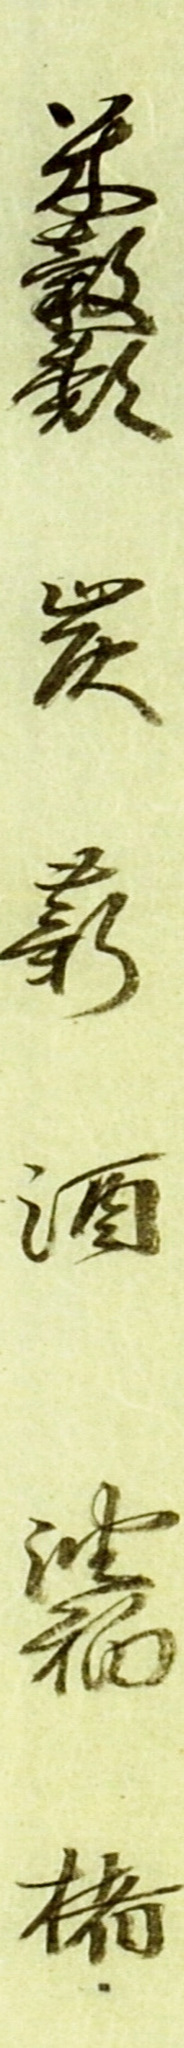米穀類炭薪酒油粕楮
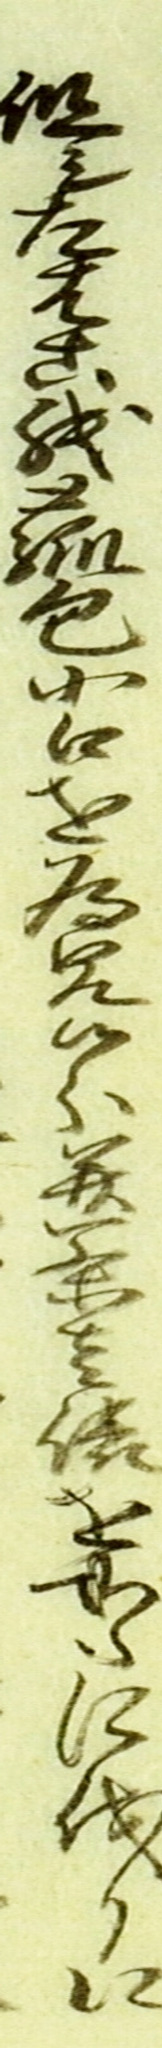但シたはこを菰包小口を為見候分并茶壱俵を弐ツに伐りに
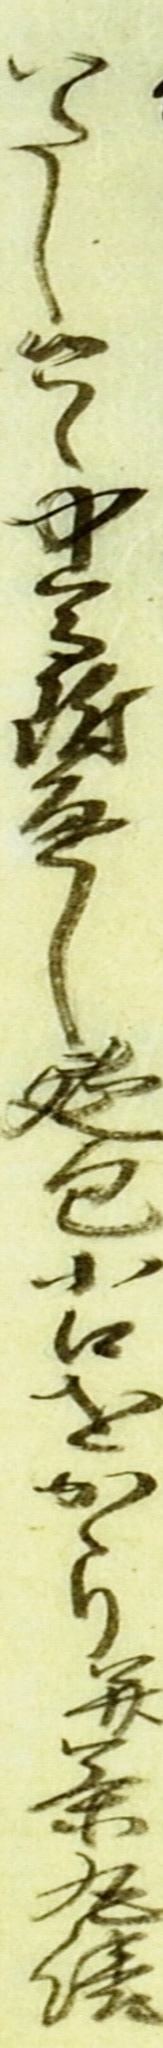いたし候ハヽ中馬附へし莚包小口をかゝり并茶丸俵
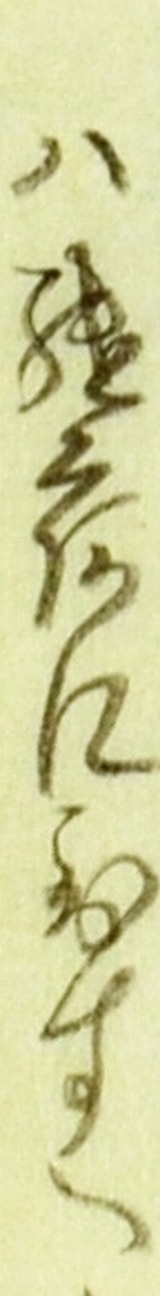ハ継荷に致すへし
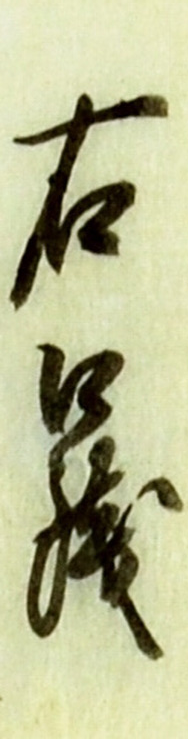右口銭
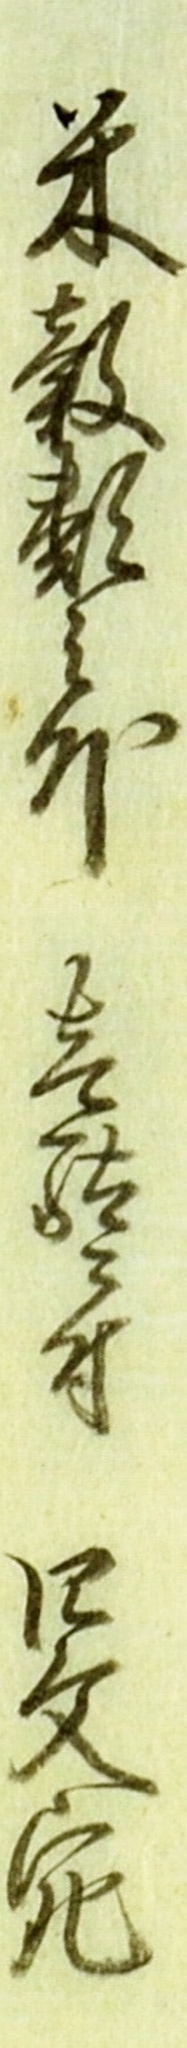米穀類之外壱駄ニ付四文宛
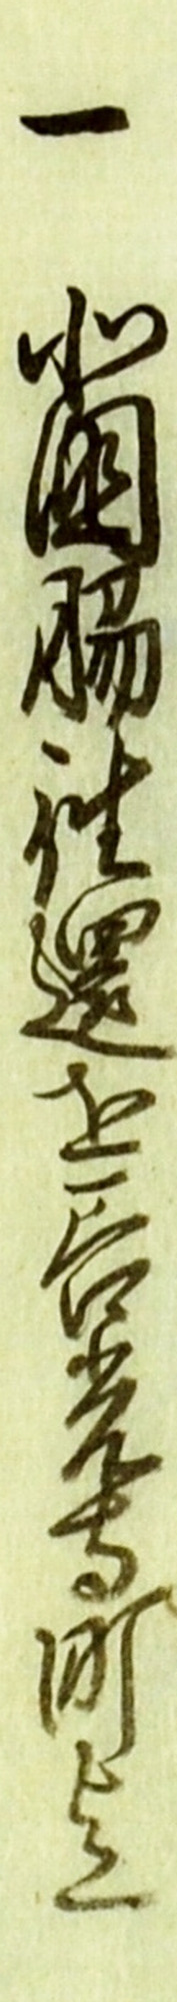一北国脇往還を善光寺町迄
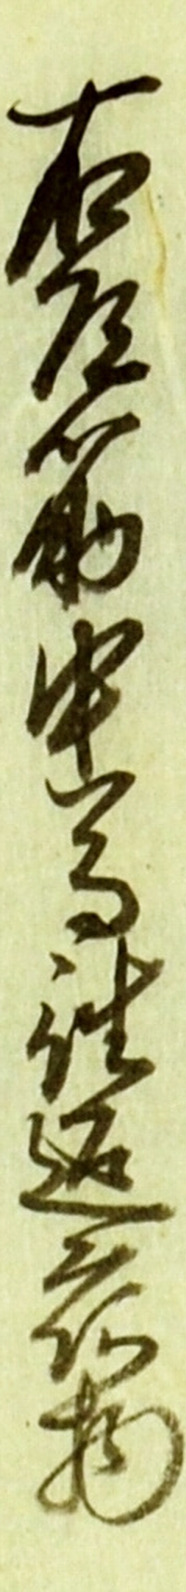右道筋中馬往返荷物
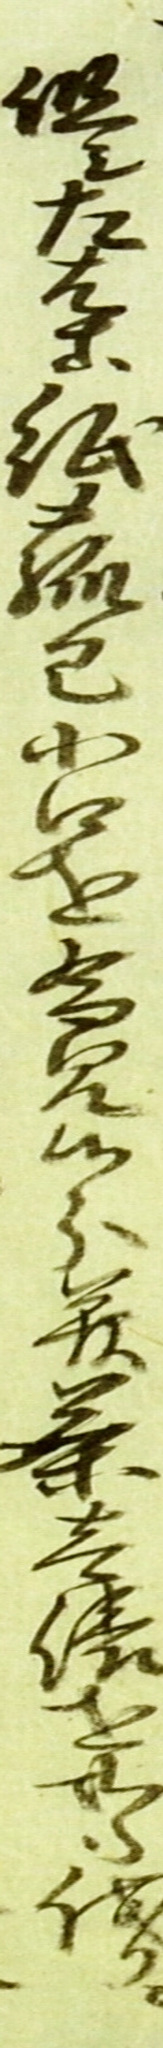但シたはこを菰包小口を為見候分并茶壱俵を弐ツに伐りに
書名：中馬荷物并口銭中馬稼之村名馬数等申渡書
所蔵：伊那市立高遠町図書館・合同会社AMANE
